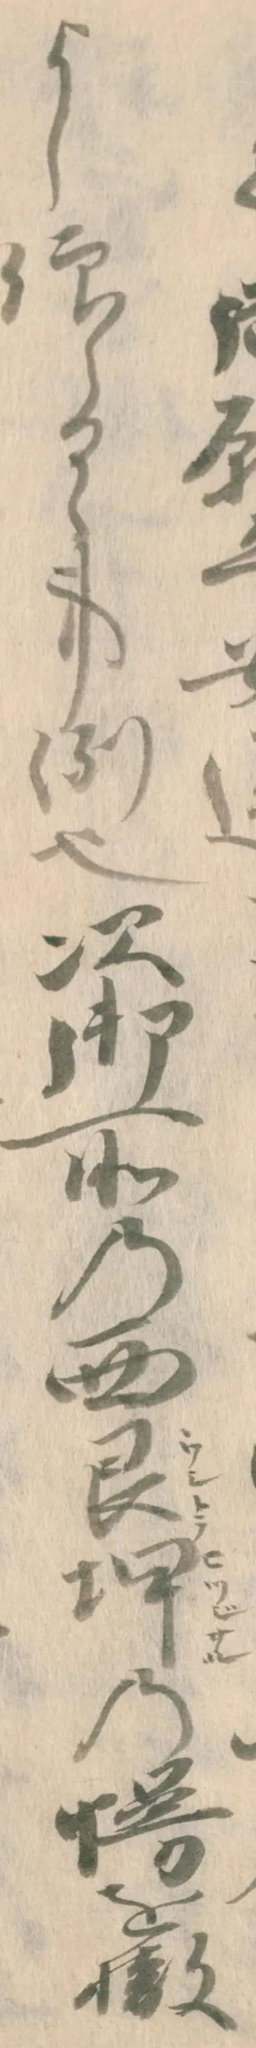よし仰らるゝ事例也次御所の西艮坤の幔を撤
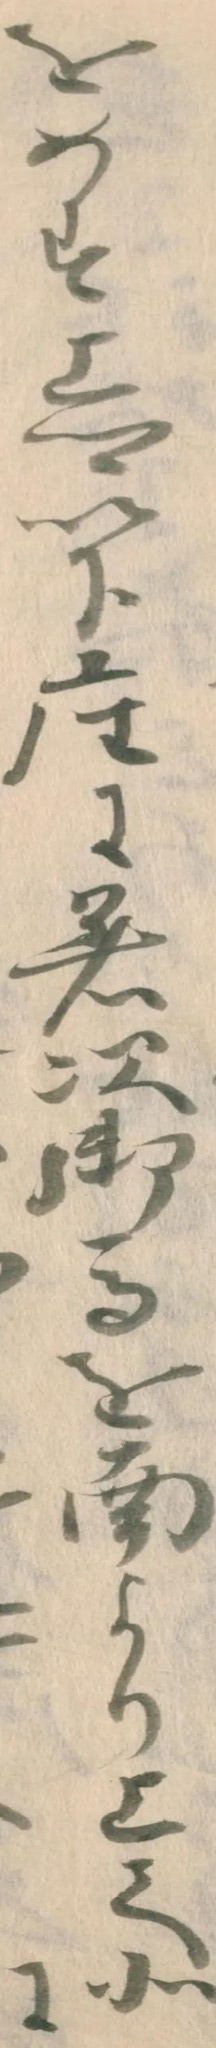をめす上卿以下座に着次御馬を南より上て北に
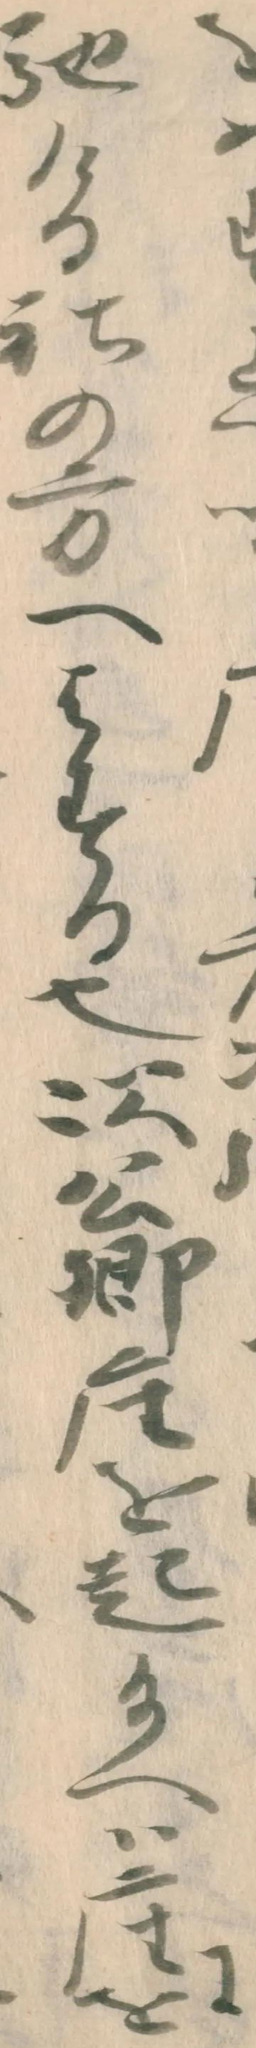馳ける社の方へはする也次公卿座を起給へは座を
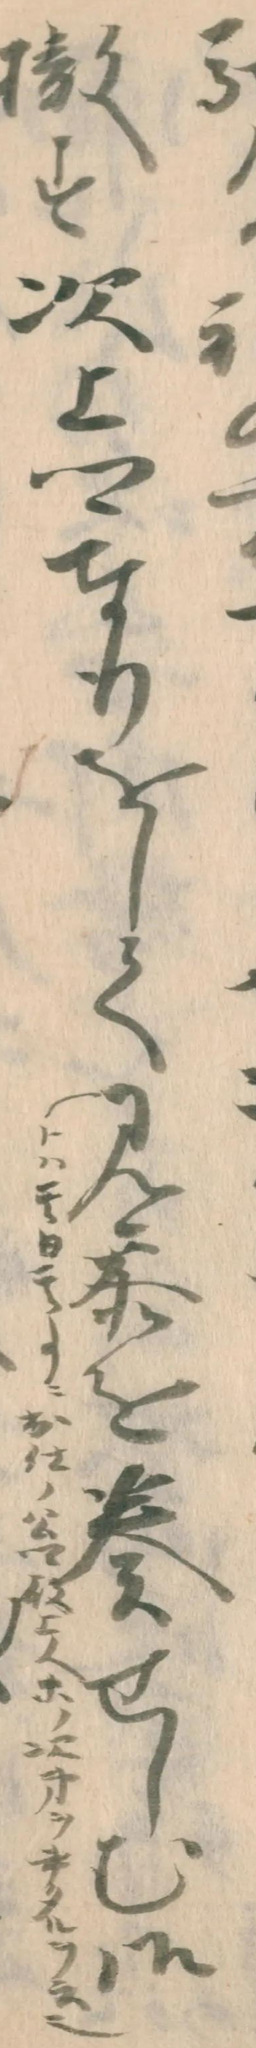撤す次上卿奉行をして見参を奏せしむ御
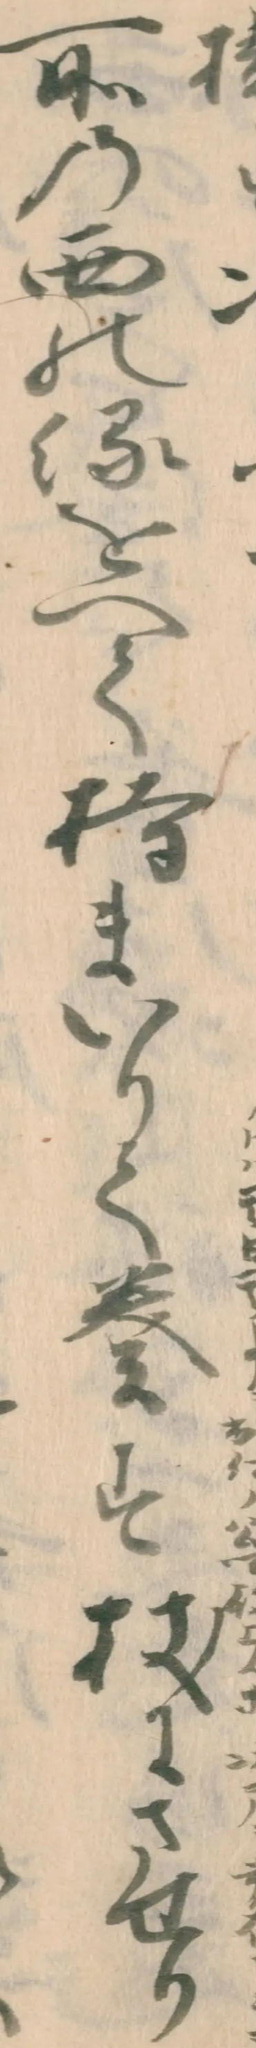所の西の縁をへて持まいりて奏す杖にさせり
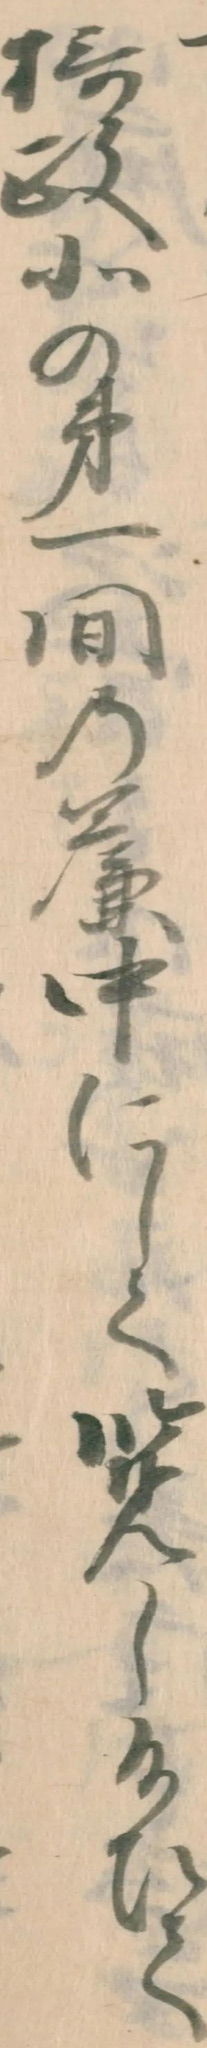摂政北の第一間の簾中にして覧し給ひて
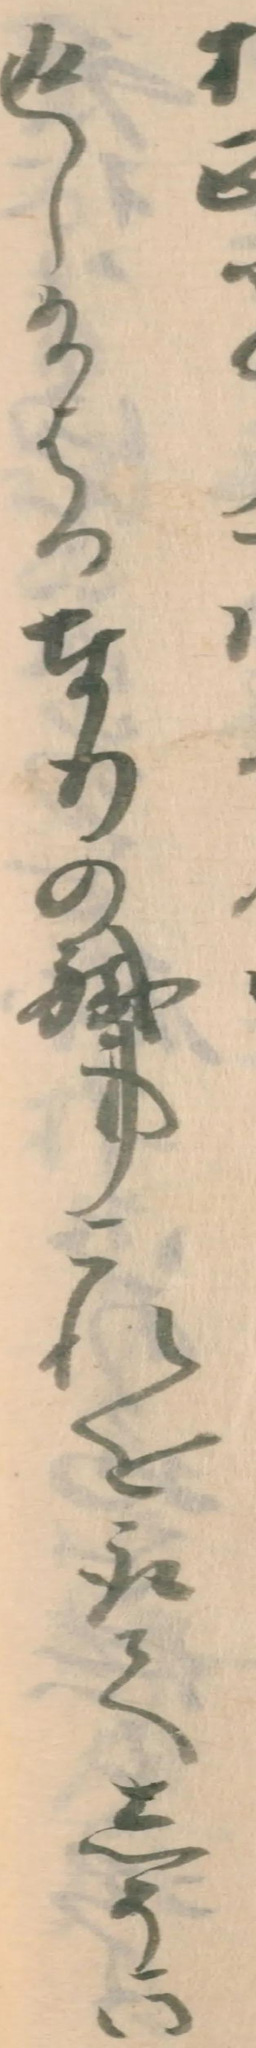返し給はる奉行の職事これを取てしそき
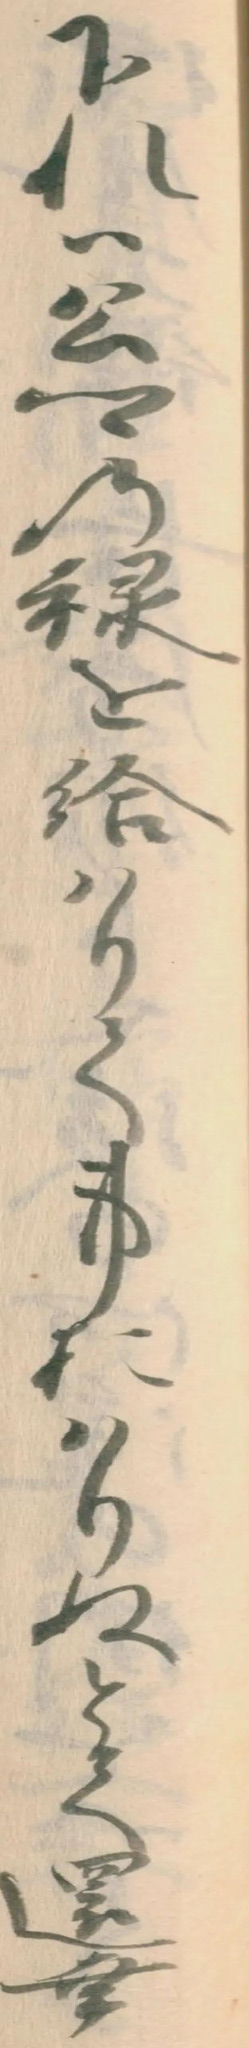下れは公卿の禄を給はりて事おはりぬとて還幸
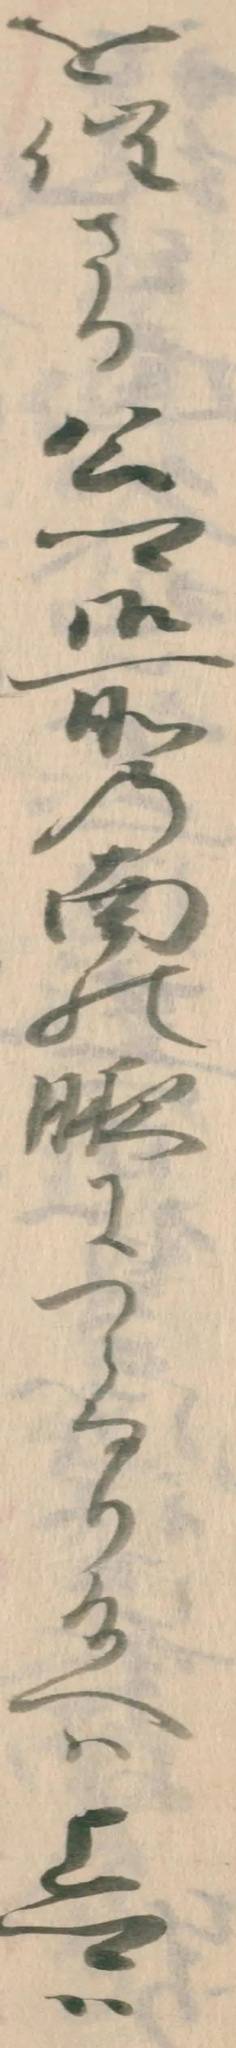を催さる公卿御所の南の腋につらなり給へは上卿は
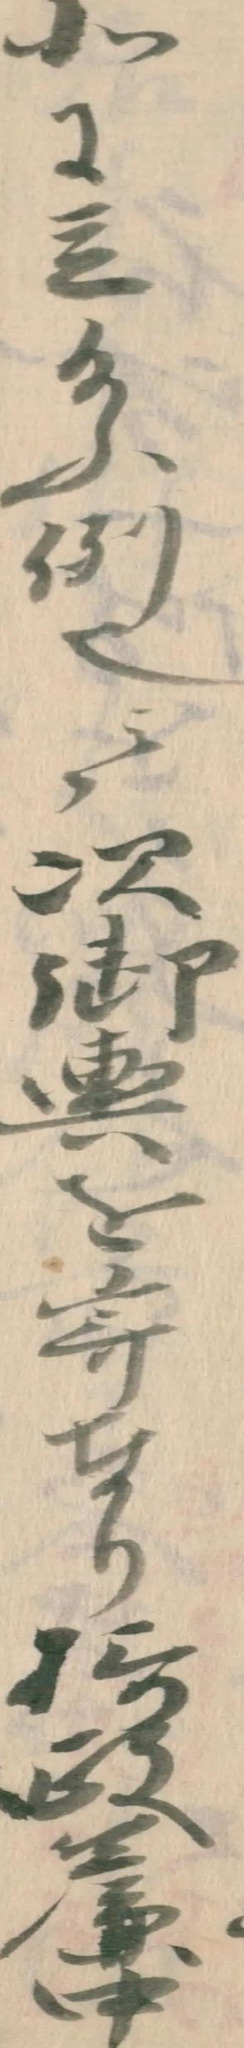北に立給ふ例也云々次御輿を寄奉り摂政簾中に
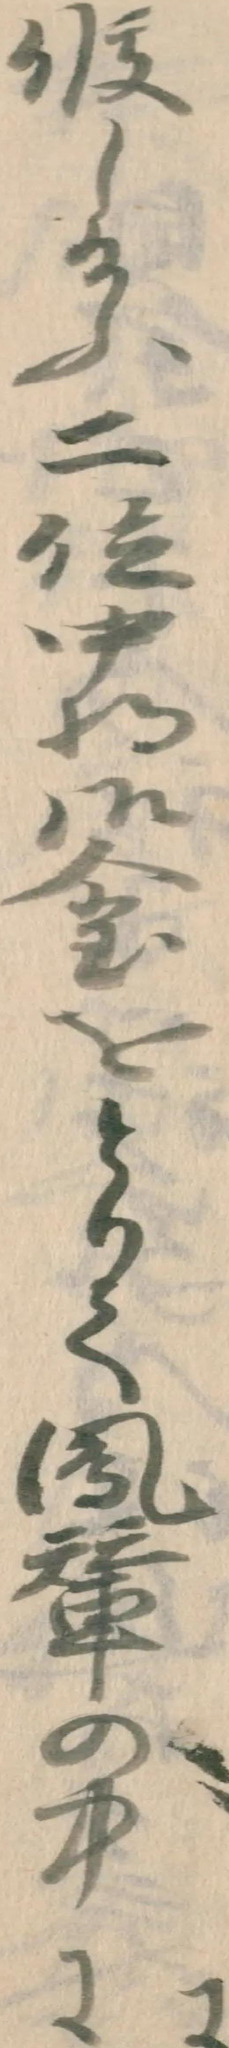候し給ふ二位中将御璽をとりて鳳輦の中に
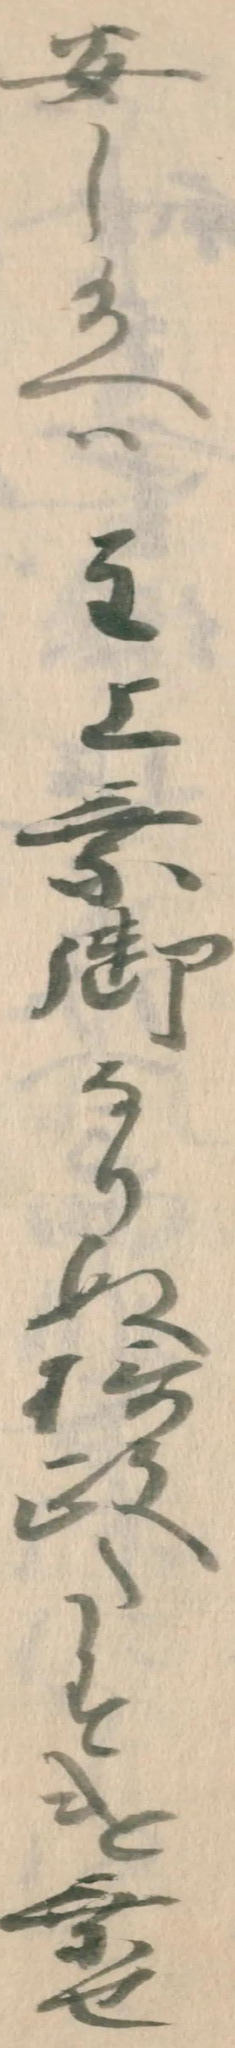安し給へは主上乗御なりぬ摂政たすけ乗せ
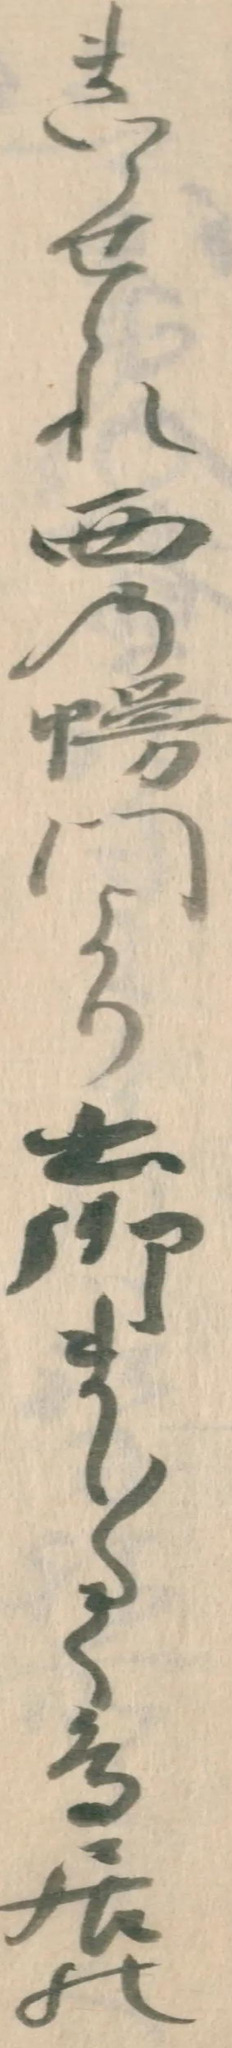まいらせられ西の幔門より出御まし〳〵て鳥居の
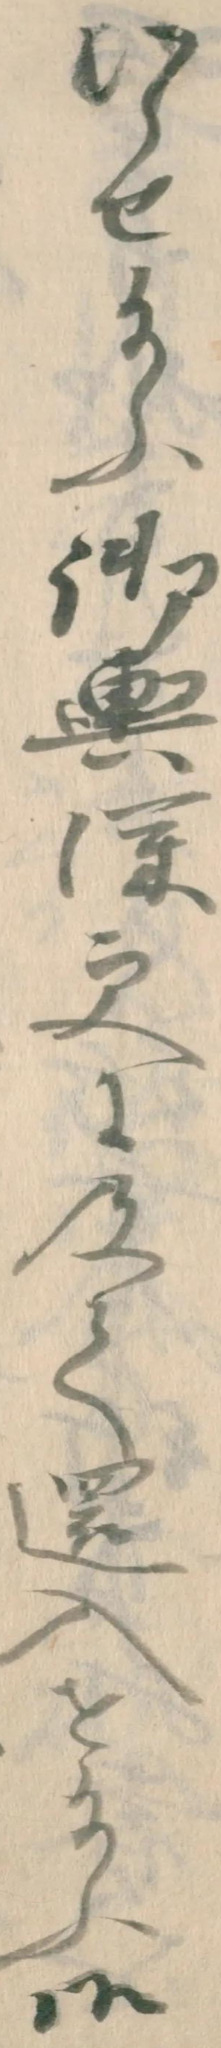ひらせ給ふ御輿深更に及て還入を給う御
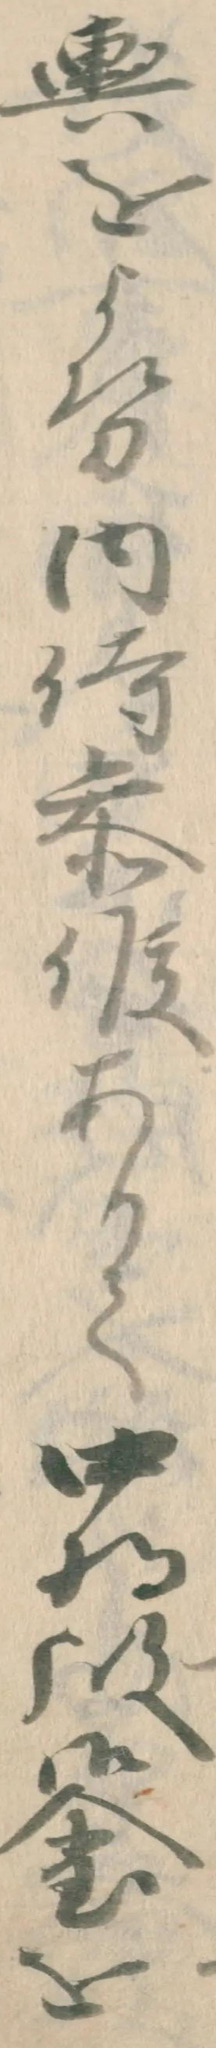輿をよせ内侍参候ありて中将殿御璽を
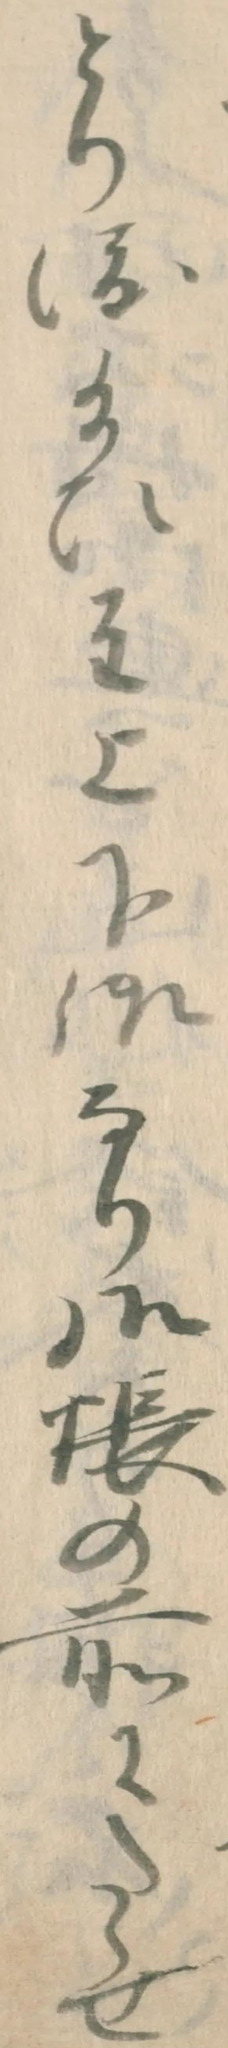とり渡給ひ主上下御なり御帳の前にたゝせ
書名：賀茂社記録. 第1冊
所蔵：国立国会図書館 National Diet Library, JAPAN
